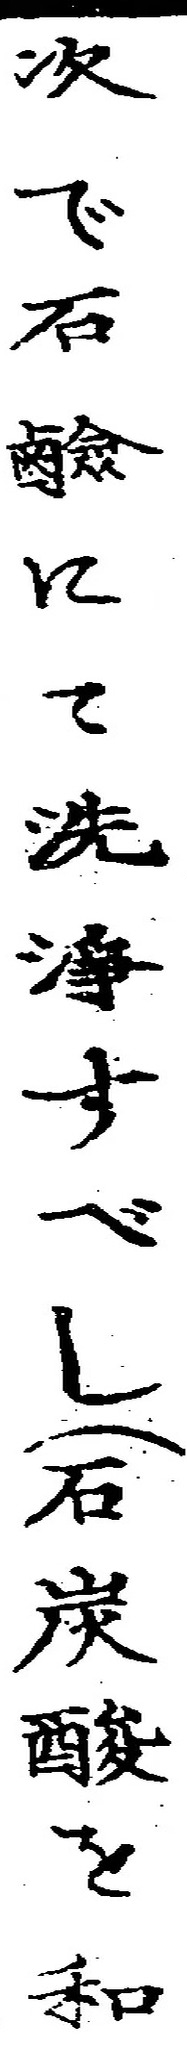次で石鹸にて洗浄すべし[石炭酸を和
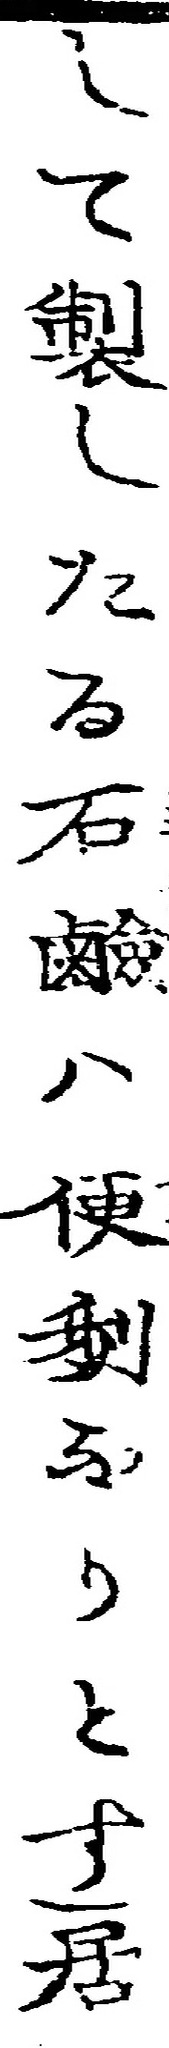して製したる石鹸は便剰なりとす]居
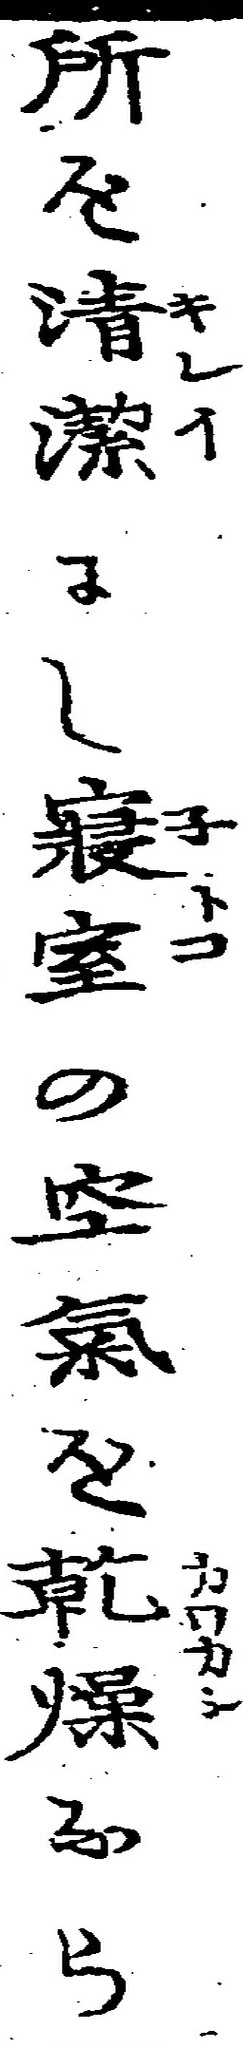所を清潔に寝室の空氣を乾燥なら
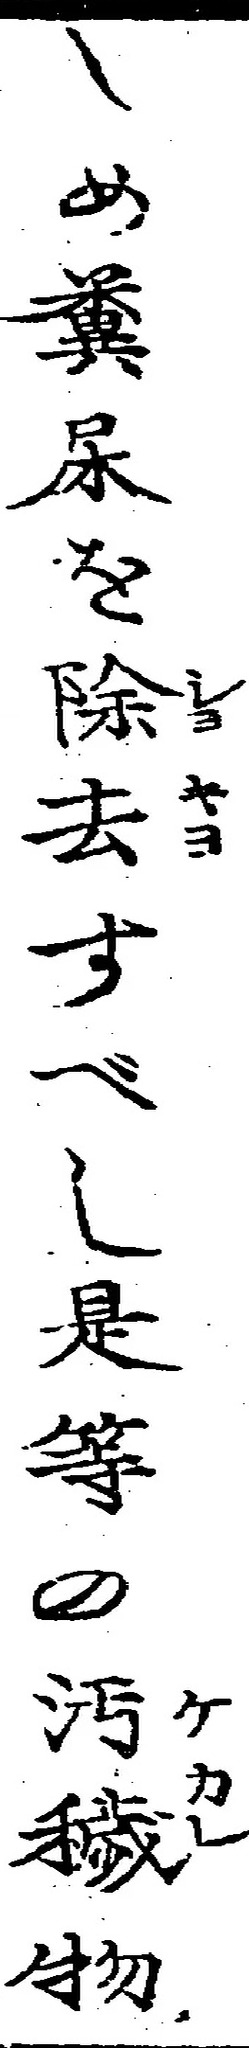しめ糞尿を除去すべし是等の汚穢物
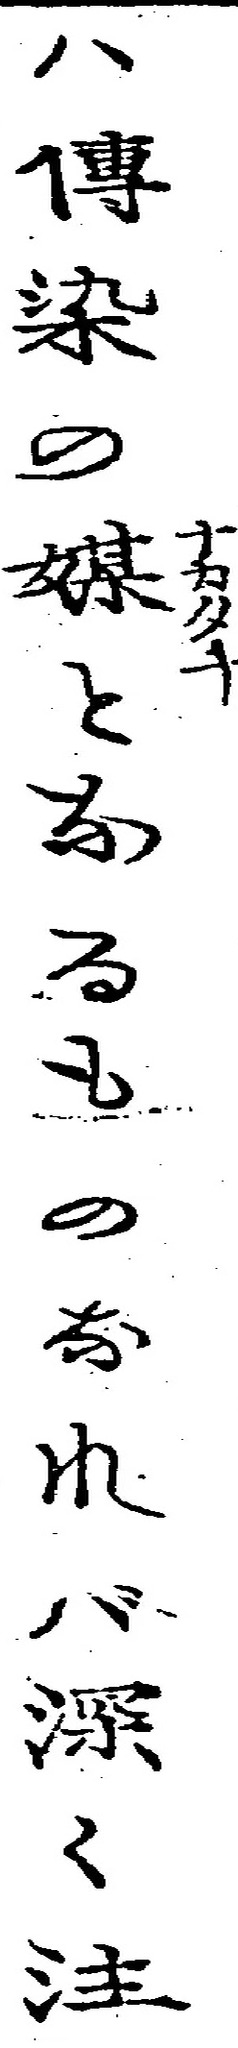は傅染の媒となるものなれば深く注
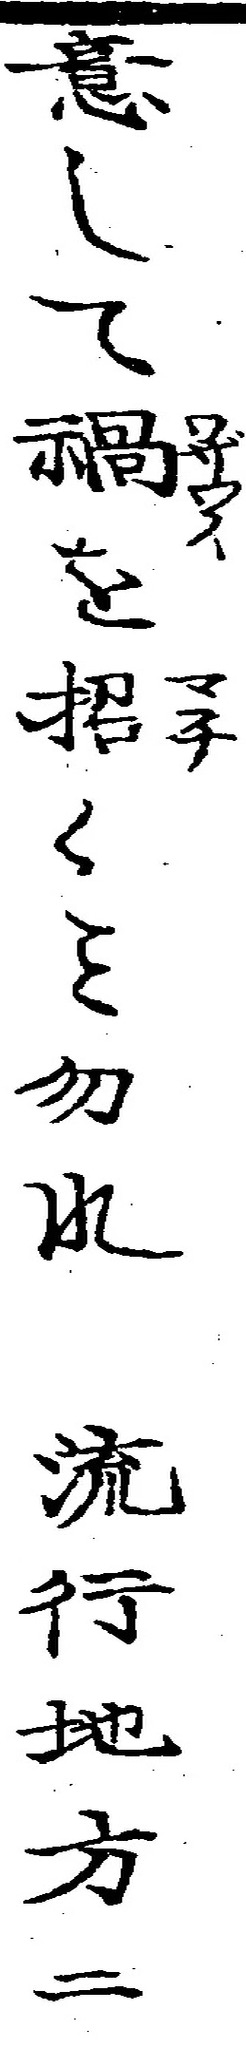意して禍を招くこと勿れ流行地方に
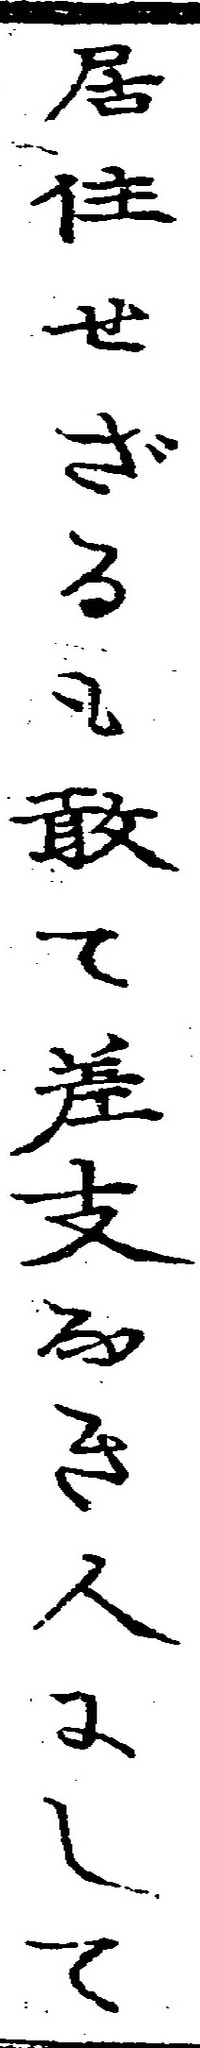居住せざるも敢て差支なき人にして
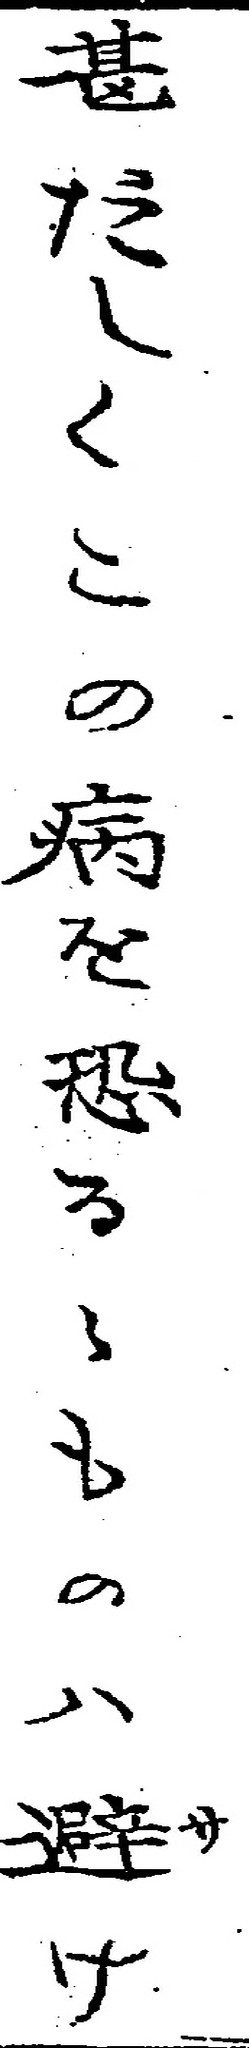甚だしくこと病を恐るゝものは避け
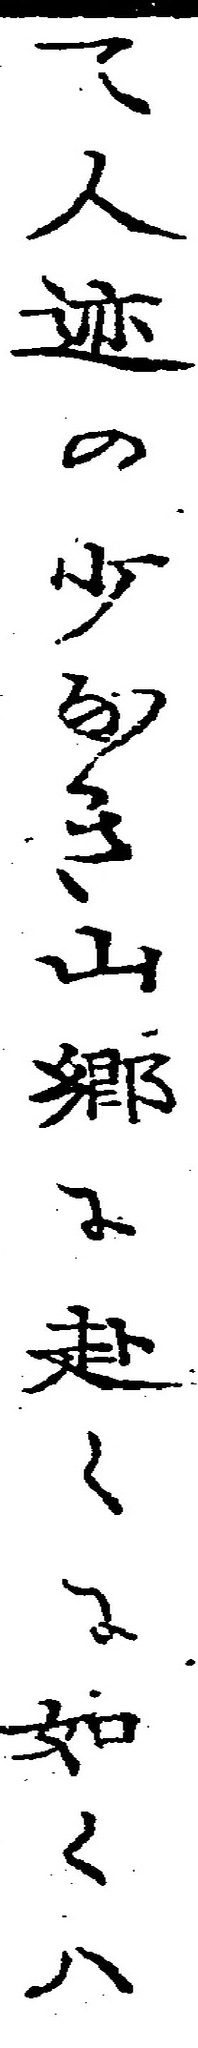て人迹の少なき山郷に赴くに如くは

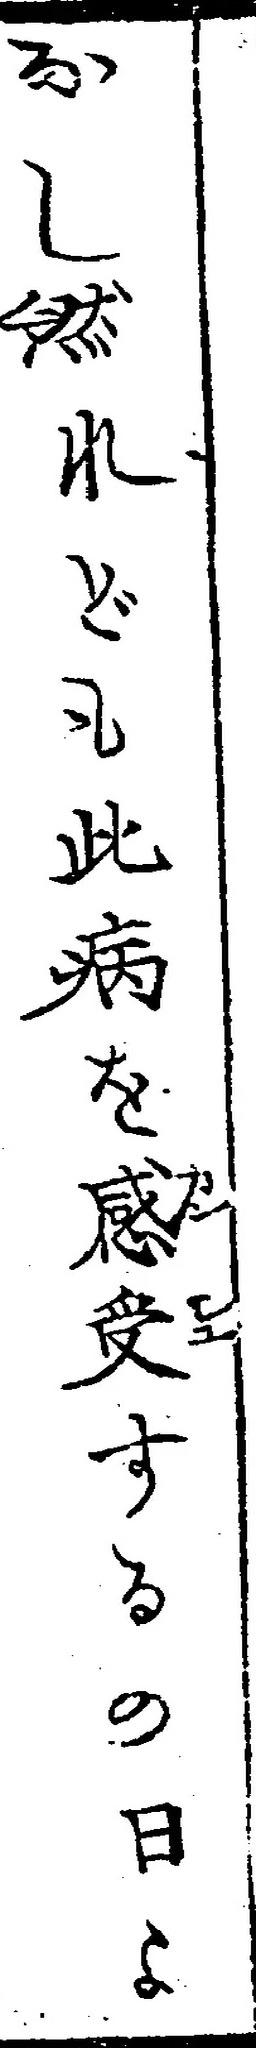なし然れども此病を感受するの日よ
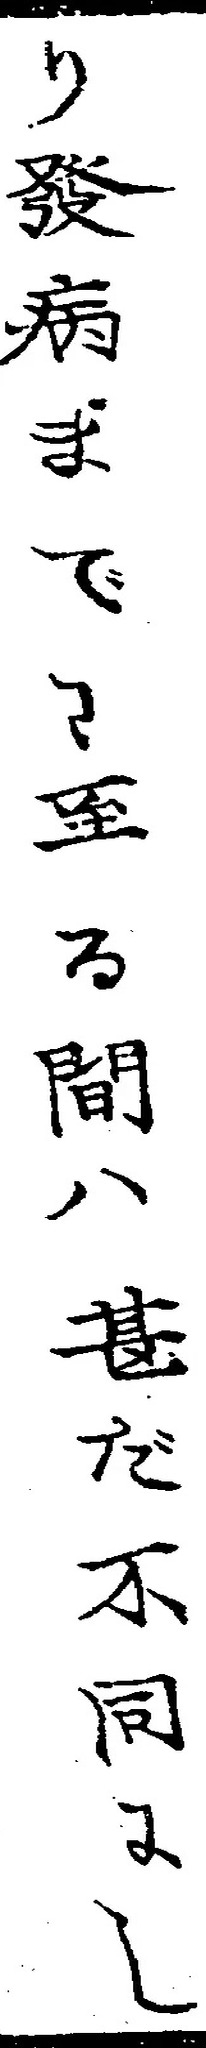り發病までに至る間は甚だ不同にし
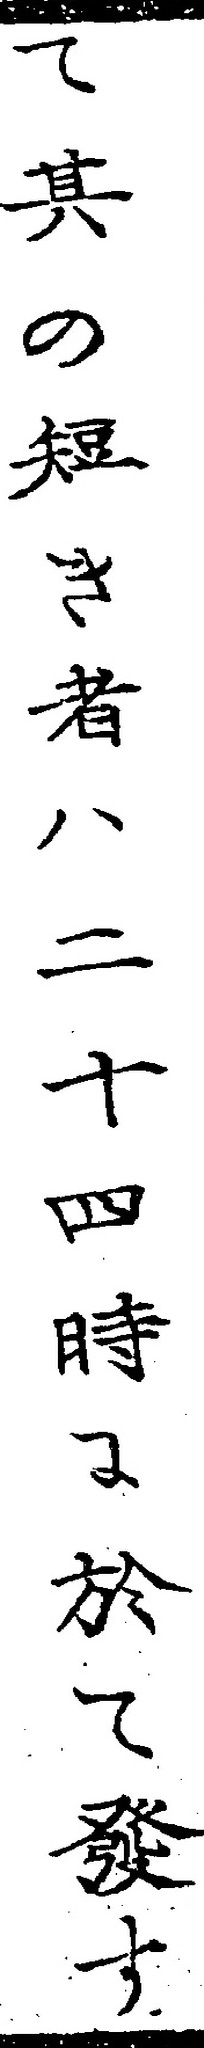て其短き者は二十四時に於て發す
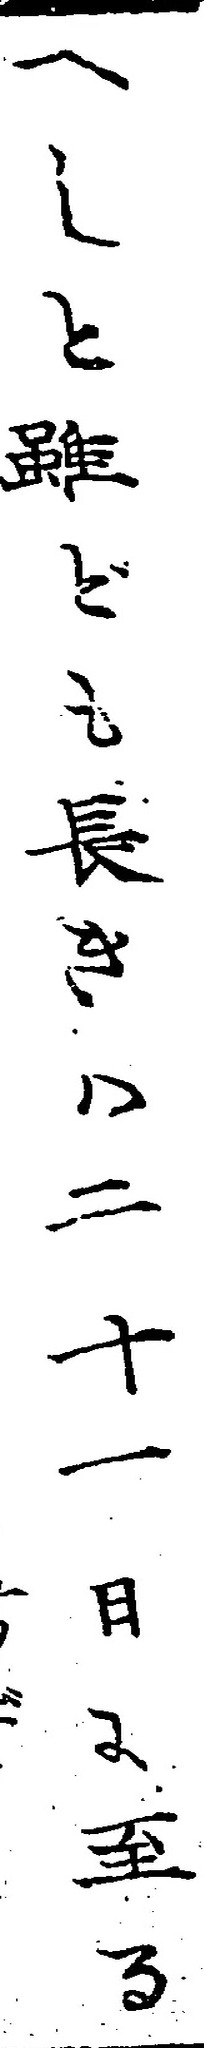へしと雖ども長きの二十一日に至る
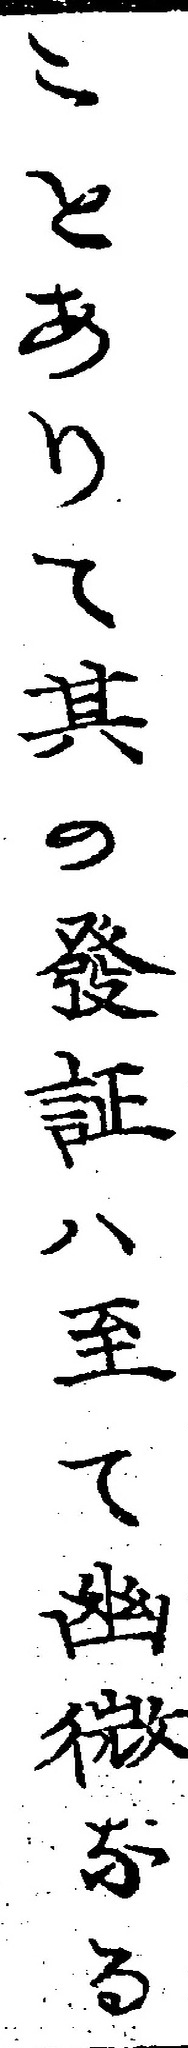ことありて其の發証は至て幽微なる
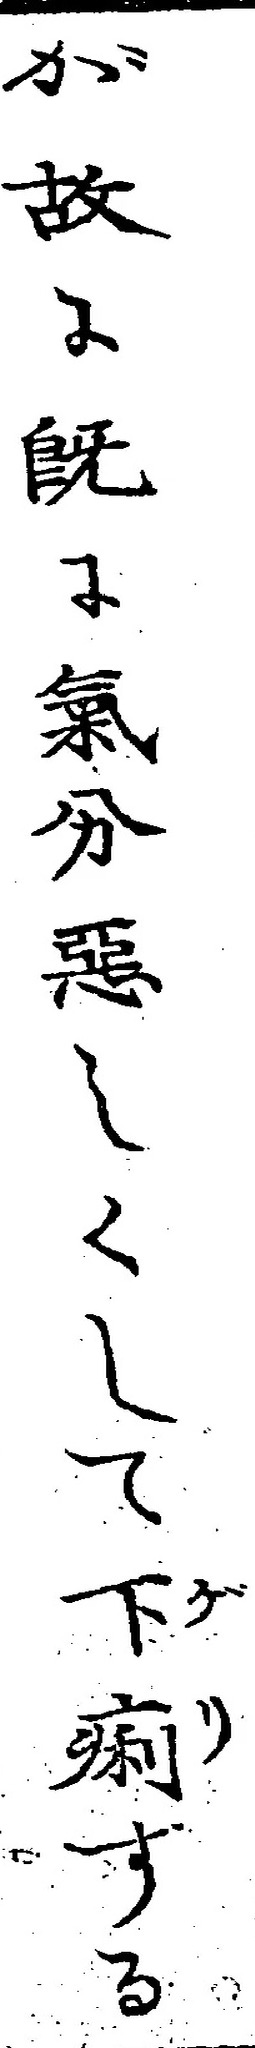た故に既に気分惡しくして下痢する
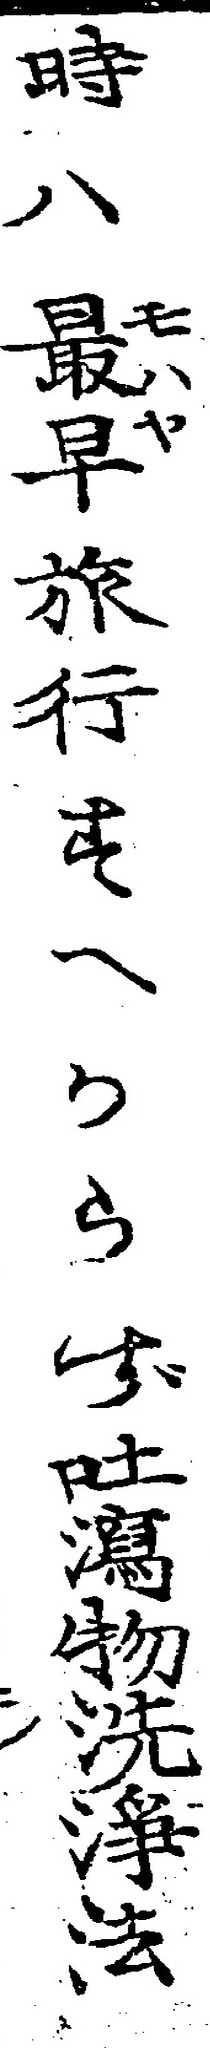時は最早旅行すへからず吐瀉物洗浄法
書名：虎列剌病予防用法
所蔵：国立国会図書館 National Diet Library, JAPAN
